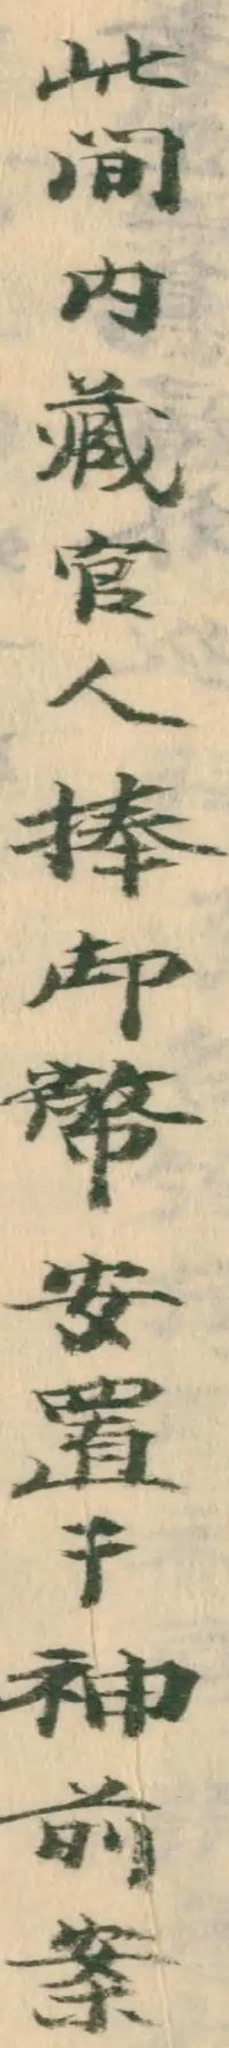此間内蔵官人捧御幣安置于神前案
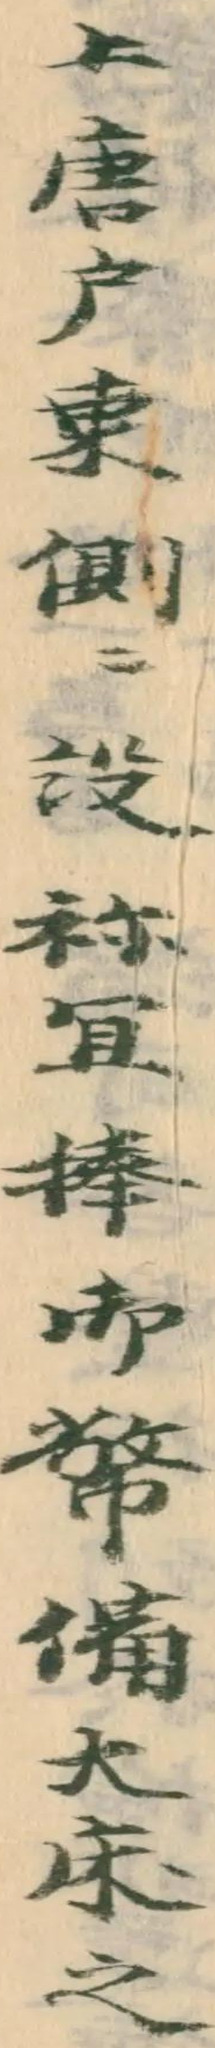上唐戸東側ニ設禰宜捧御幣備大床之
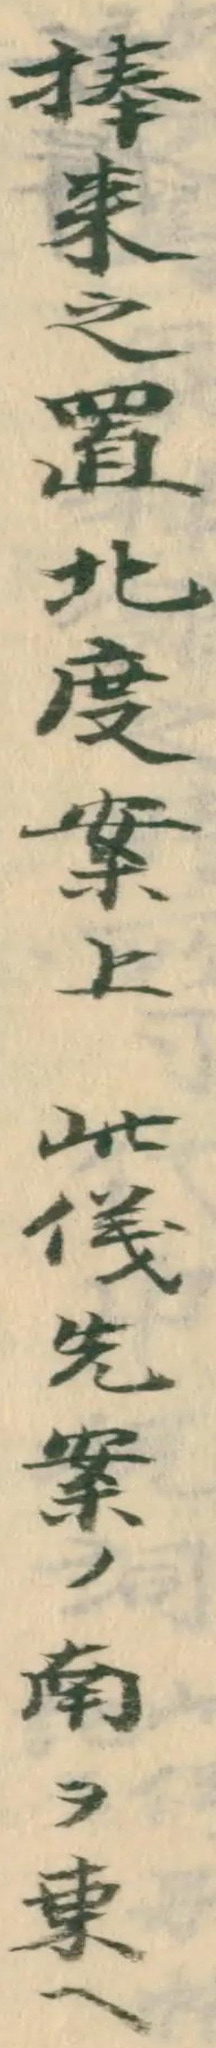捧来之置北度案上此儀先案ノ南ヲ東へ
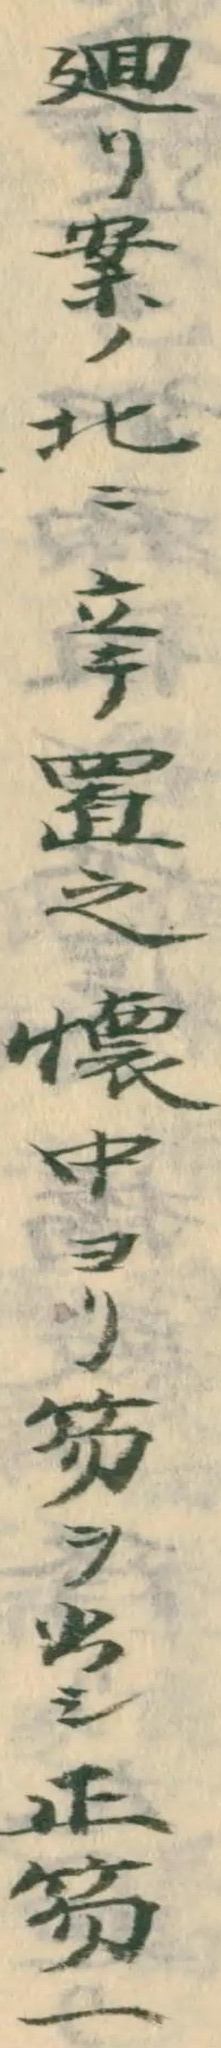廻リ案ノ北ニ立テ置之懐中ヨリ笏ヲ出シ正笏一
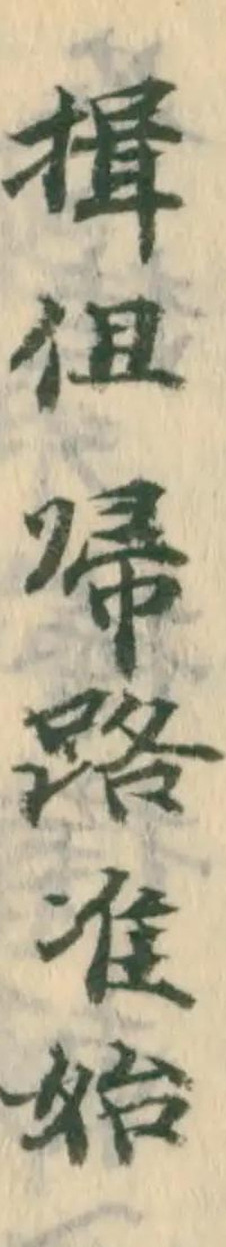揖但帰路准始

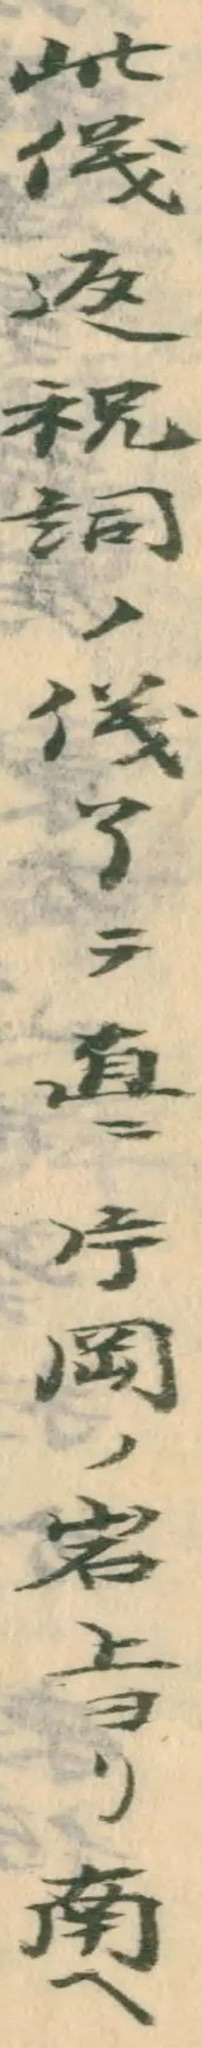此儀返祝詞ノ儀了テ直ニ片岡ノ岩上ヨリ南へ
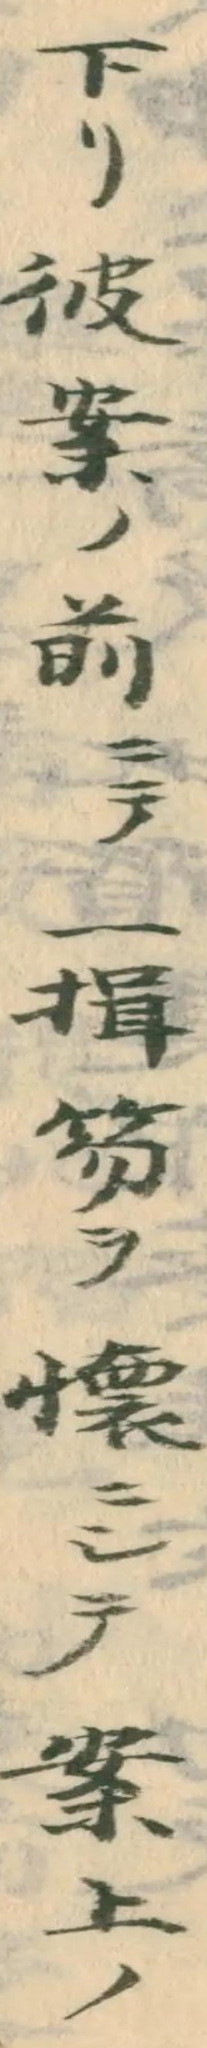下リ彼案ノ前ニテ一揖笏ヲ懐ニシテ案上ノ
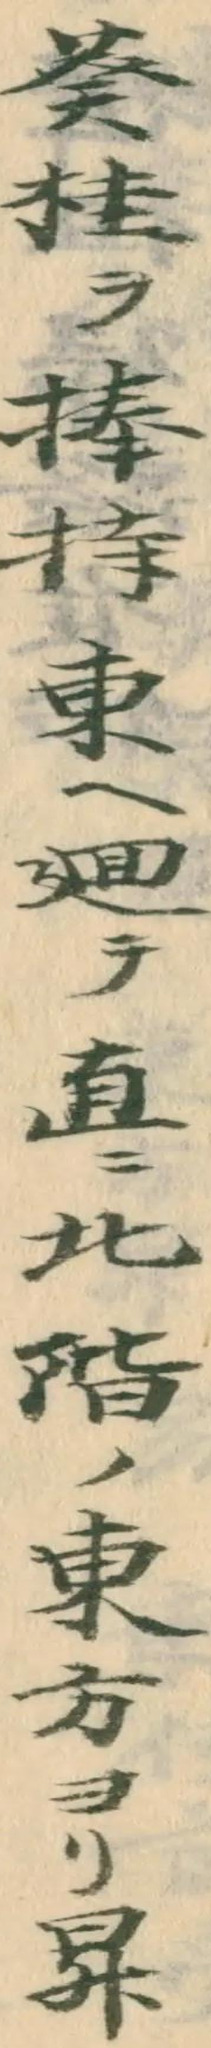葵桂ヲ捧持東へ廻テ直ニ北階ノ東方ヨリ昇
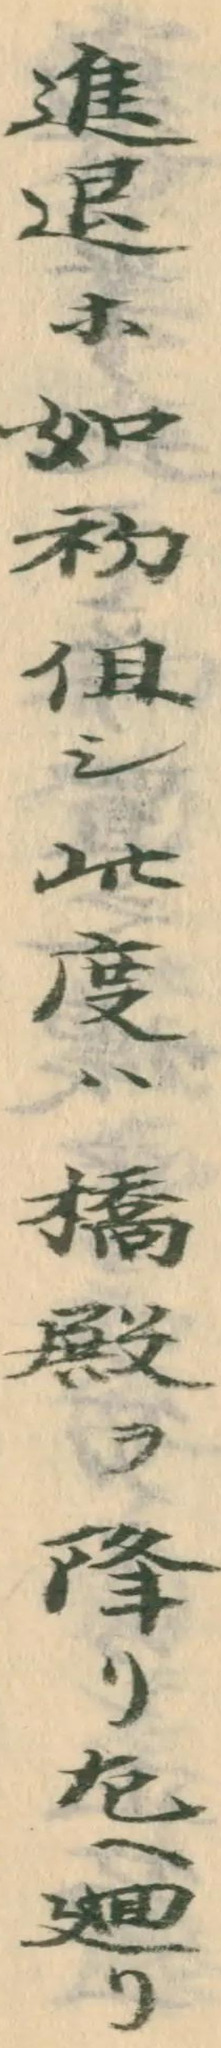進退等如初但シ此度ハ橋殿ヲ降リ左へ廻リ
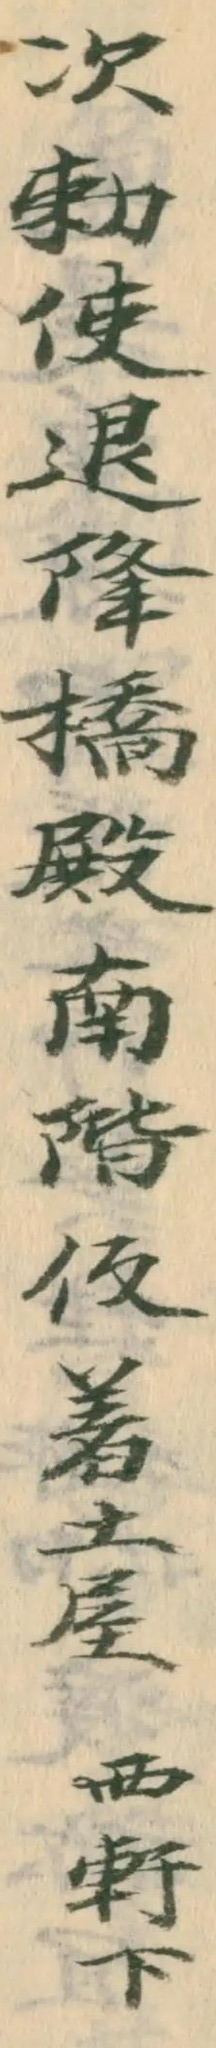次勅使退降橋殿南階仮着土屋西軒下
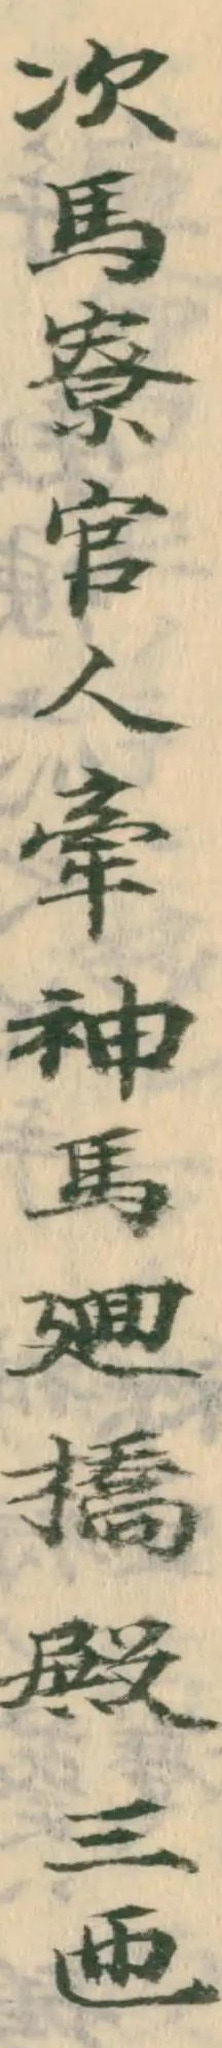次馬寮官人牽神馬廻橋殿三迊
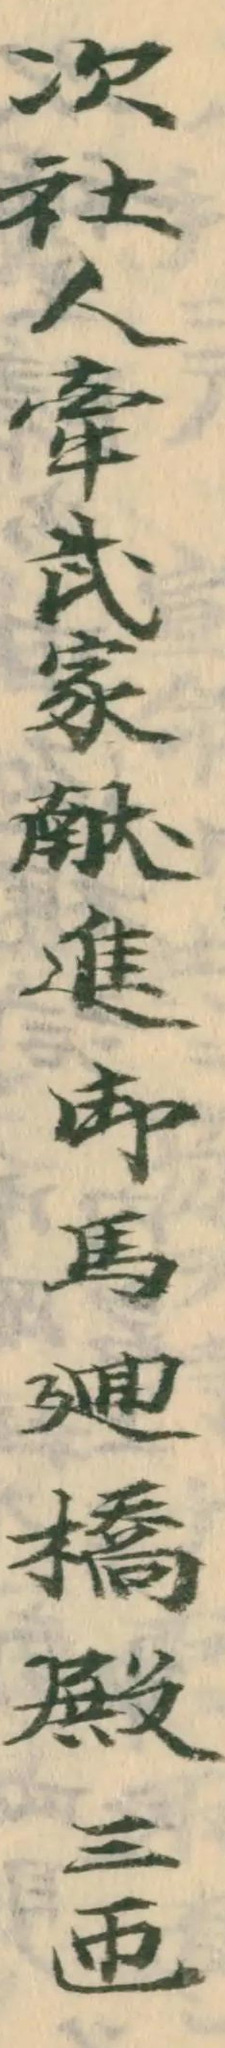次社人牽武家献進御馬廻橋殿三迊
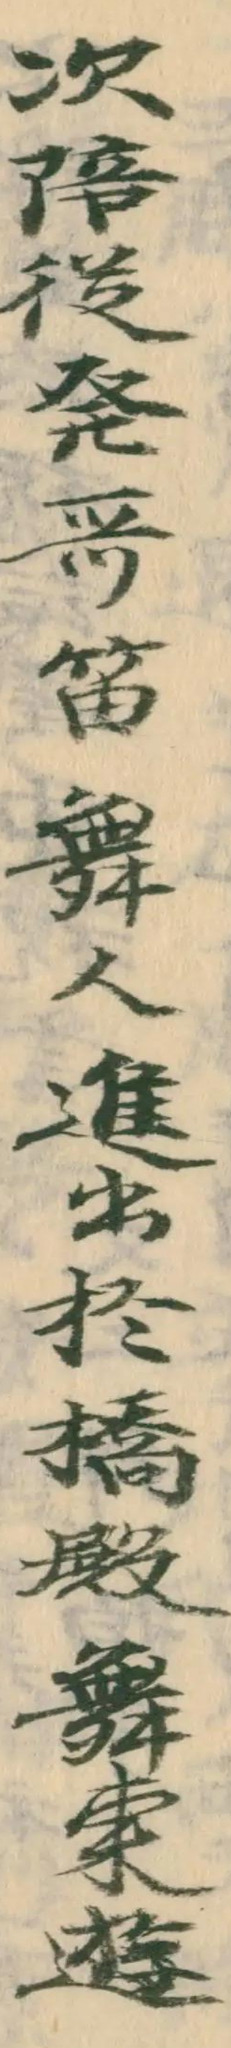次陪従発歌笛舞人進出於橋殿舞東遊
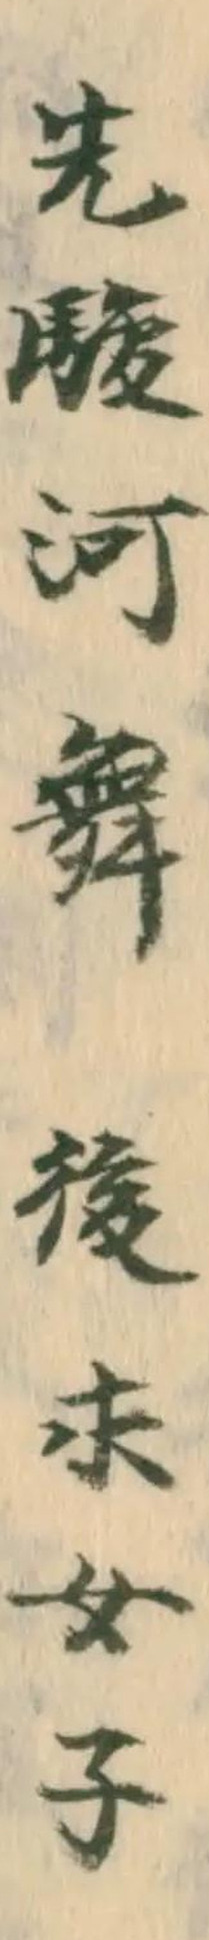先駿河舞後求女子
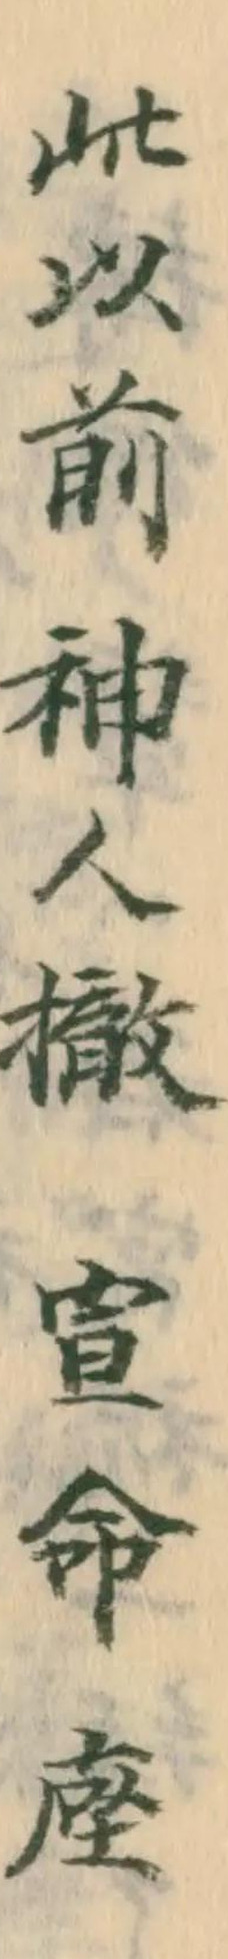此以前神人撤宣命座
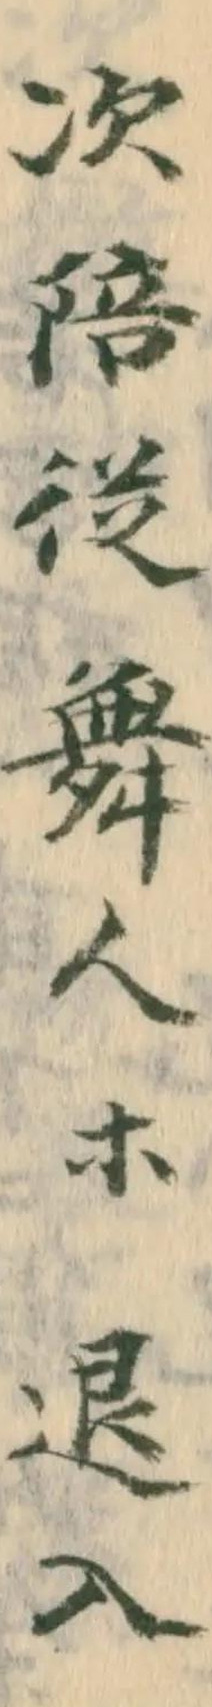次陪従舞人等退入
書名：賀茂社記録. 第5冊
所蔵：国立国会図書館 National Diet Library, JAPAN
